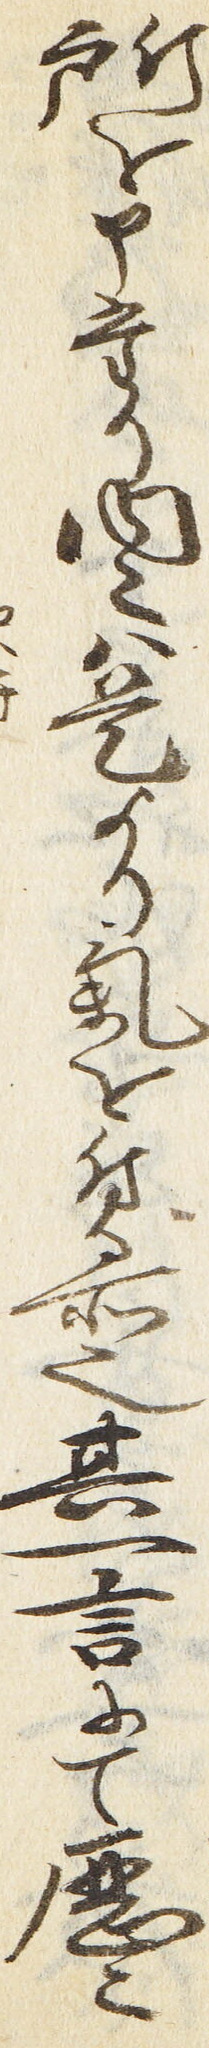所を申たり内々は是より気を付る所也其一言にて歴々
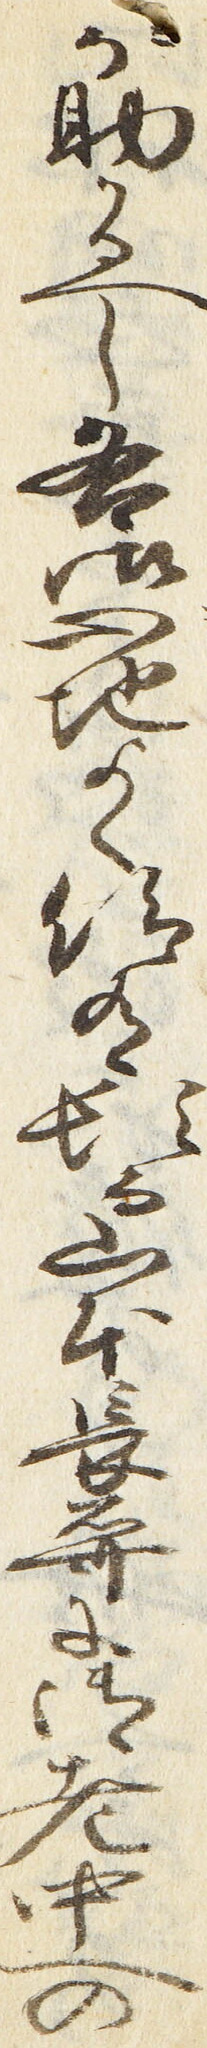が助かるへし各御心地よく仰有頓而山本長に御老中への
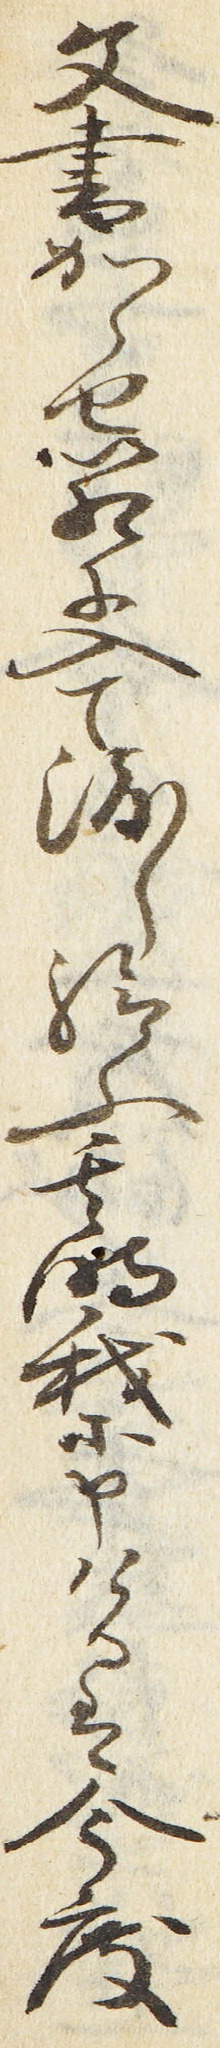文書かゝせ箱に入て渡し給ふ其時我等申けるは今度

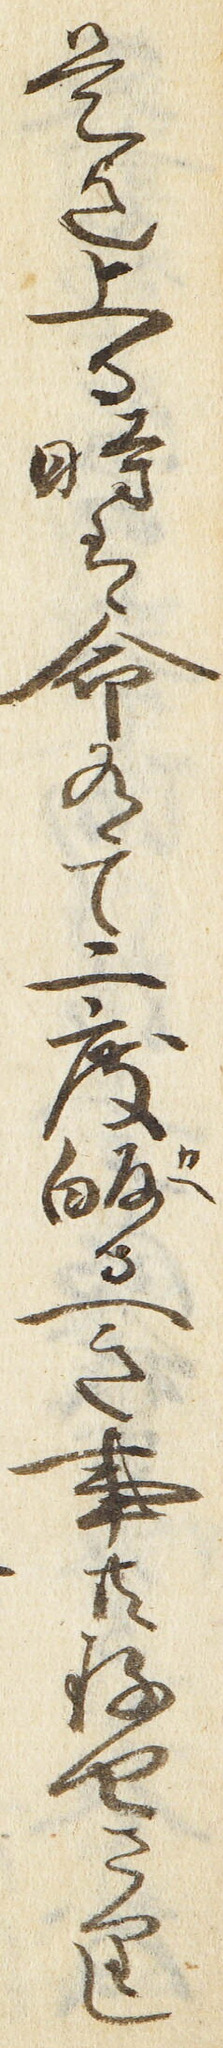是迄上る時は命有て二度皈るへき事共存せさりし
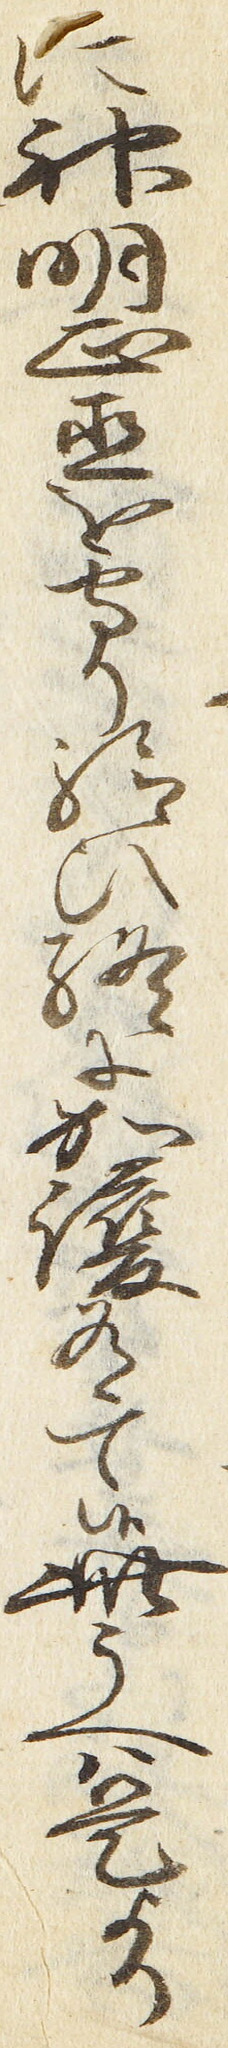に神明正直を守り給ひ終に加護有て候此うへは是より
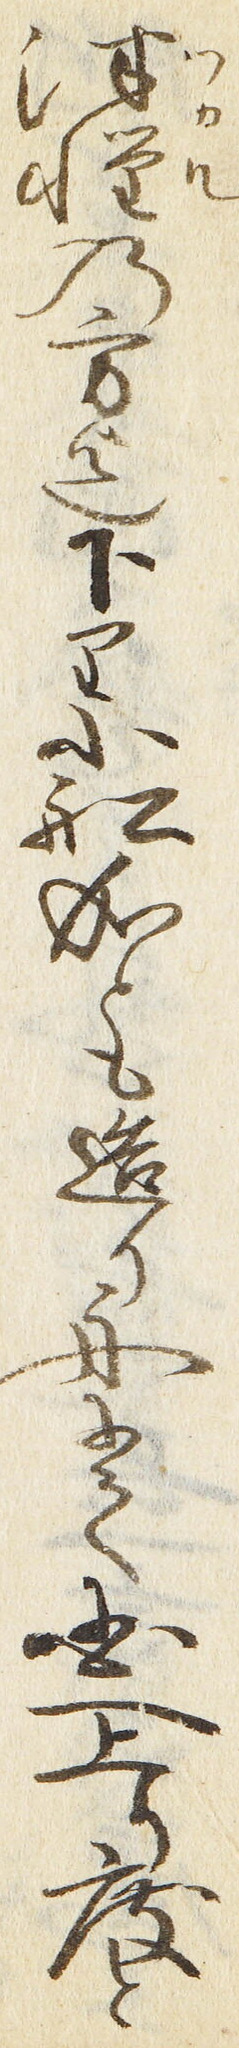津軽の方迄下り小船成とも造り舟にて国へ上り度と
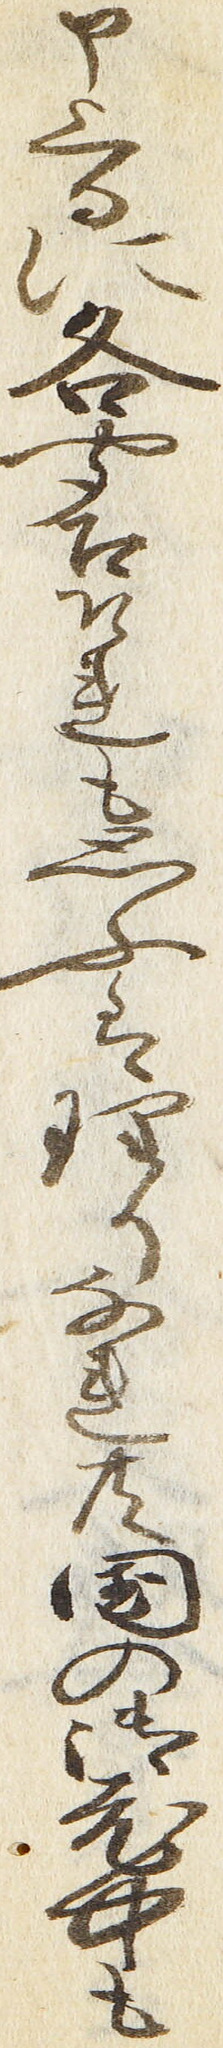申上るに各聞召それも思ふは理りなれ共国の御老中も
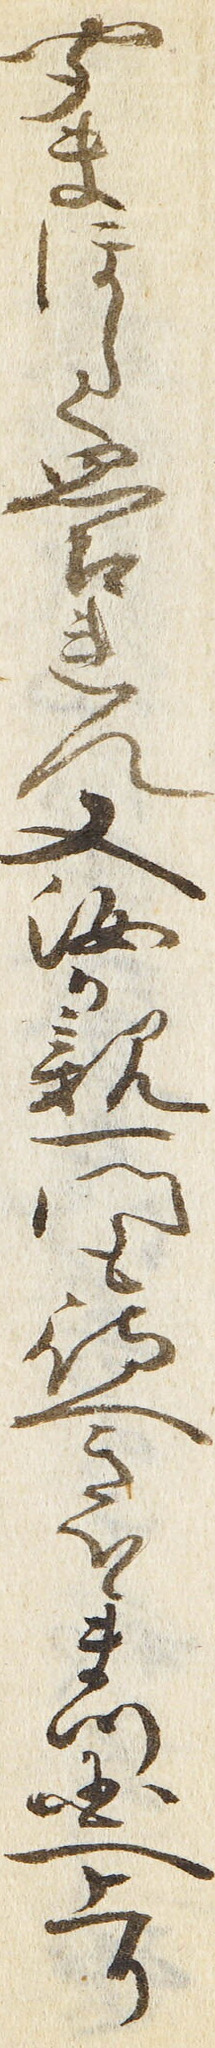聞まほしく思召れん又汝か親一門も待へきそまつ国へ上り
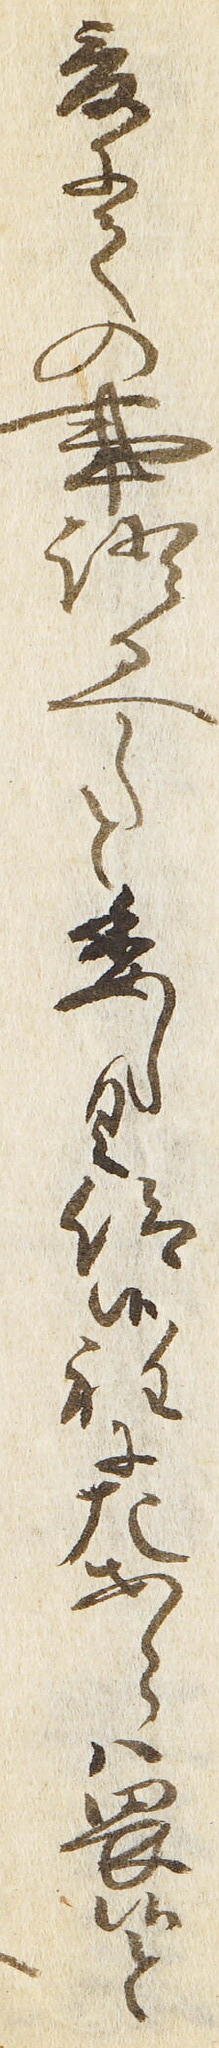爰にての事語るへしと委しく仰候程に左あらは畏候と
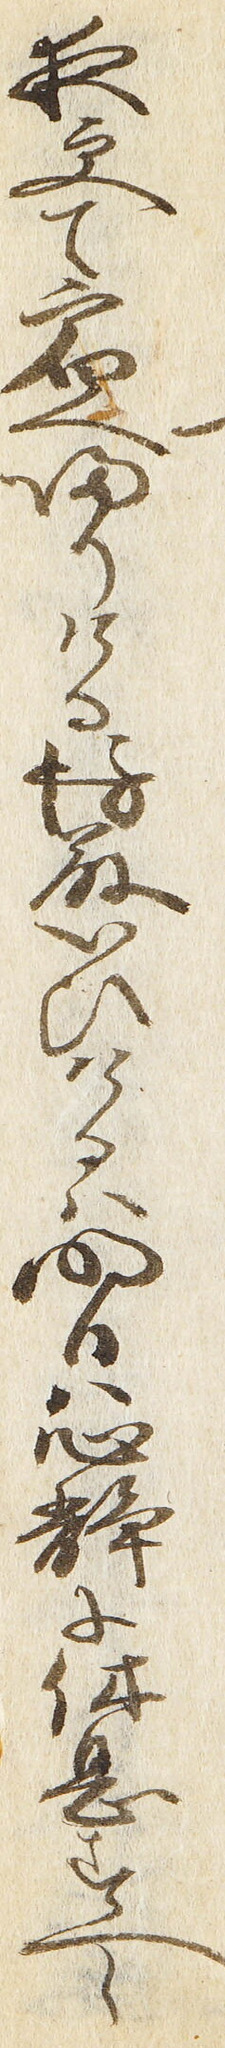夜更て宿へ帰りける後藤いひけるは明日は心静に休息すへし
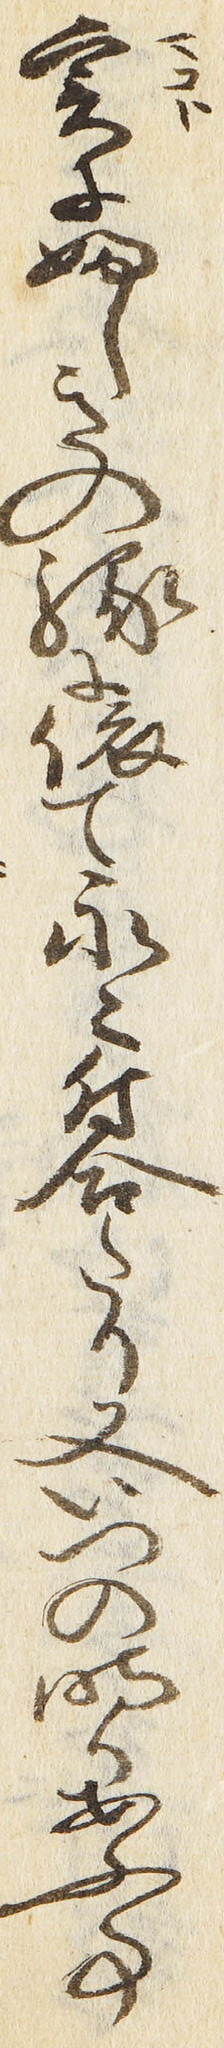実にふしきの縁に依て永々付合たり又いつの時かあふ事
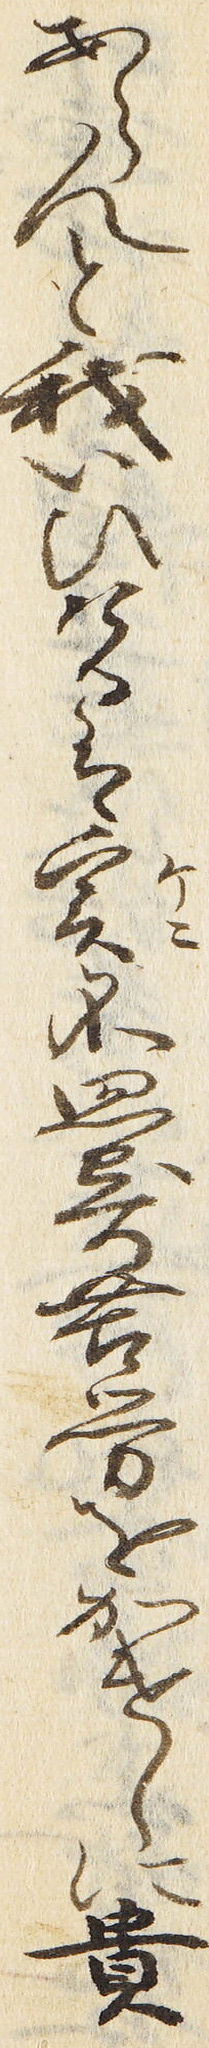あらんと我いひけるは実不思寄苦労をかけしに貴
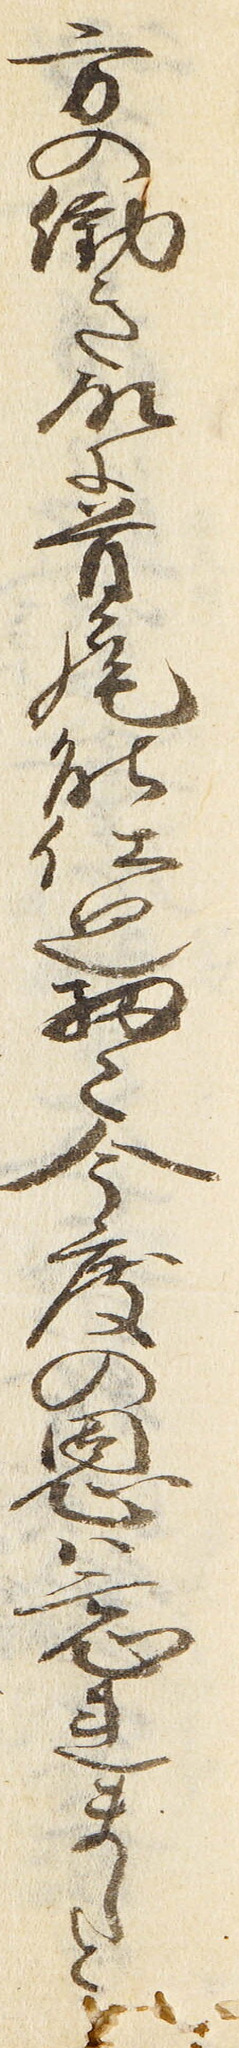方の働き故に首尾能仕廻扨々今度の恩は忘れましと
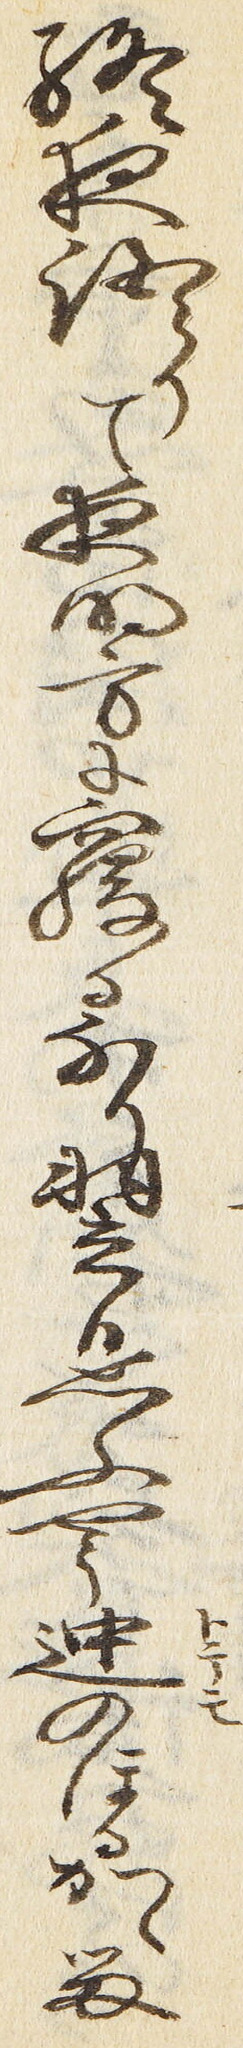終夜語りて夜明方に寝るなり翌日思ふやう迚のほるかゝる
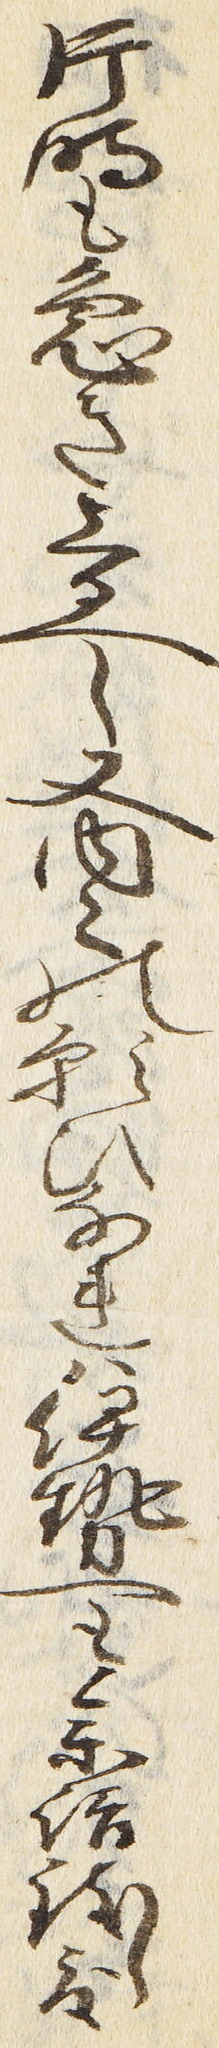片時も急き上るへし又内々の願ひなれは伊勢へも参詣致し度
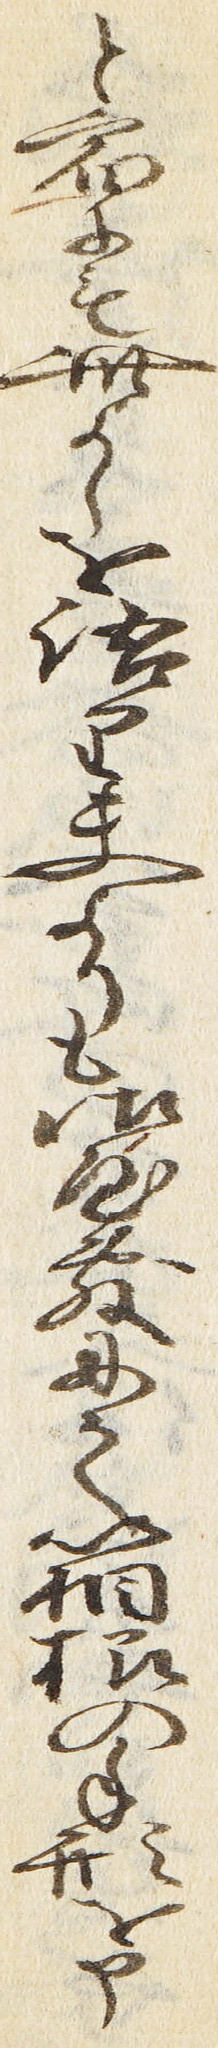と宿にも此よしを語り夫よりも御屋敷にて箱根の手形を申
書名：海陸世話日記
